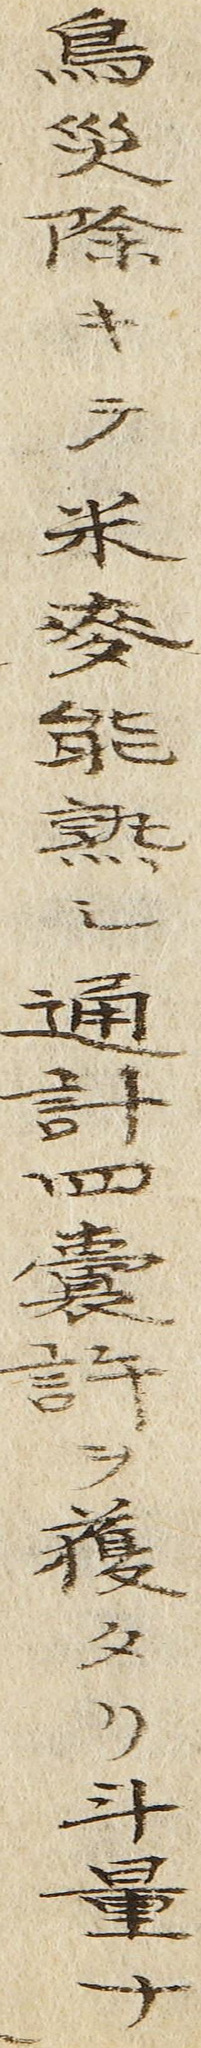鳥災除キテ米麦能熟し通計四嚢許ヲ獲タリ斗量ナ
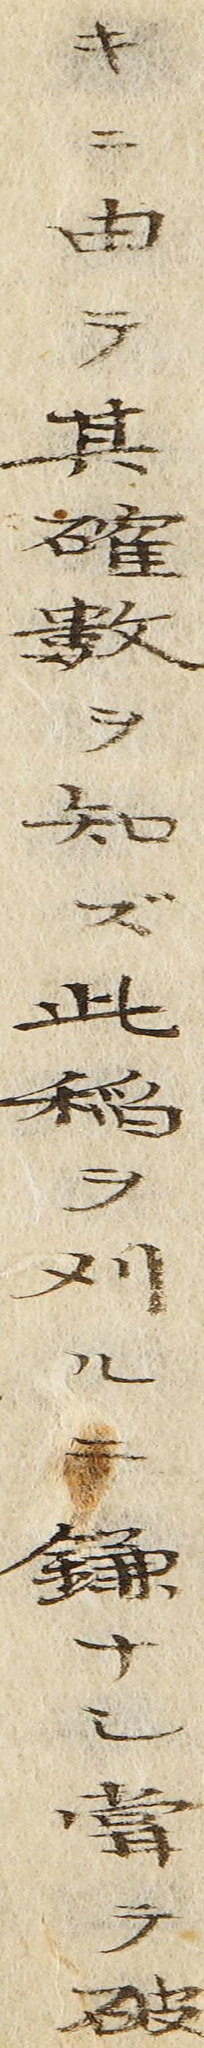キニ由テ其確数ヲ知ズ此稲ヲ刈ルニ鎌ナシ嘗テ破
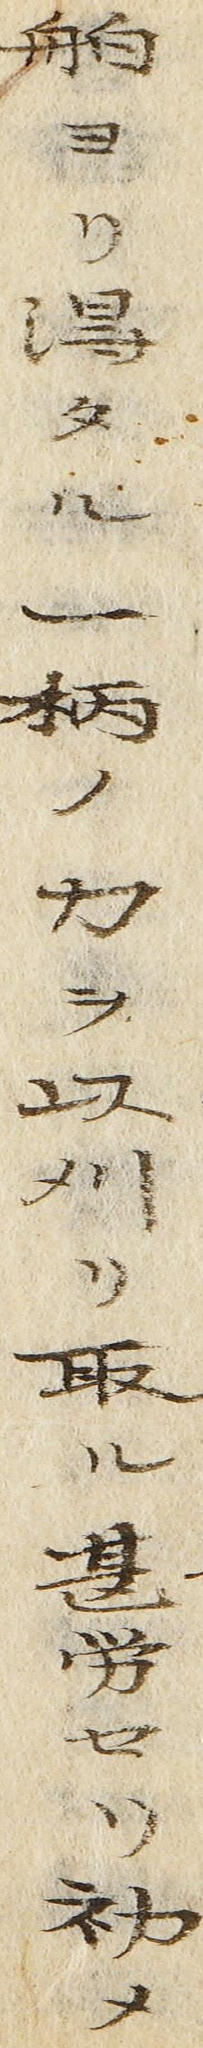舶ヨリ得タル一柄ノ刀ヲ以刈リ取ル甚労セリ初メ
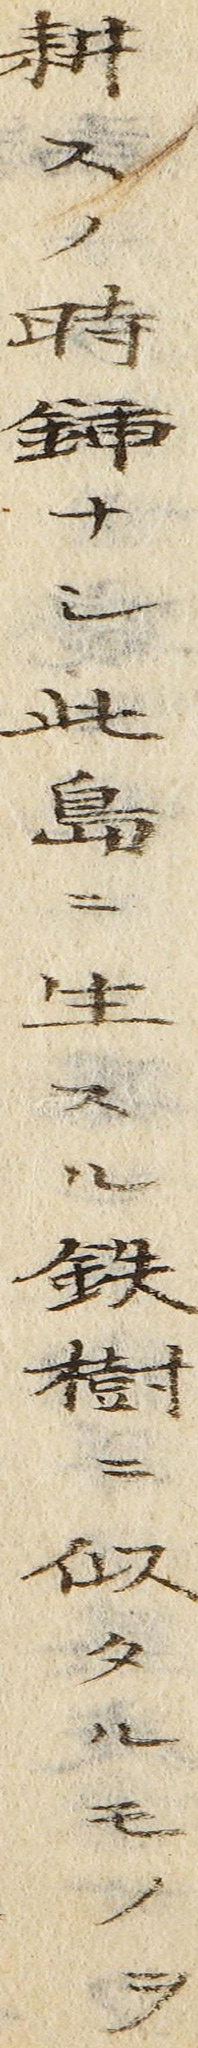耕スノ時鍤ナシ此島ニ生スル鉄樹ニ似タルモノヲ
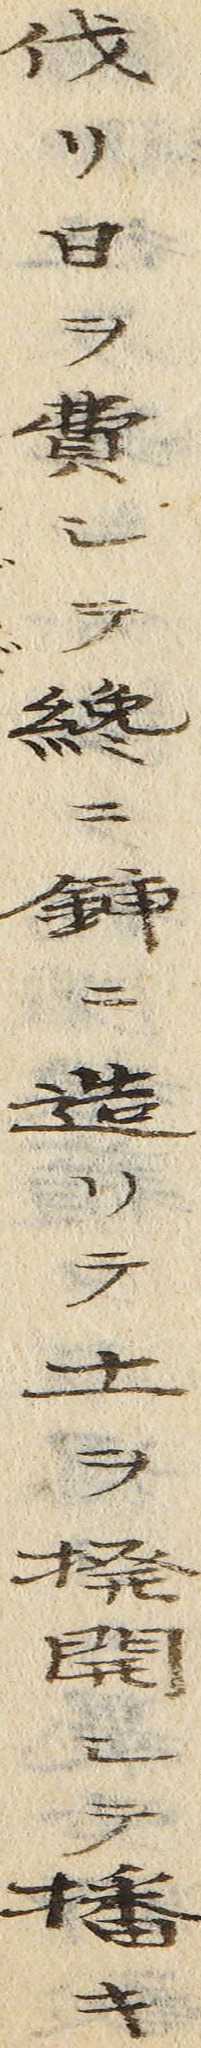伐リ日ヲ費シテ纔ニ鍤ニ造リテ土ヲ撥開シテ播キ
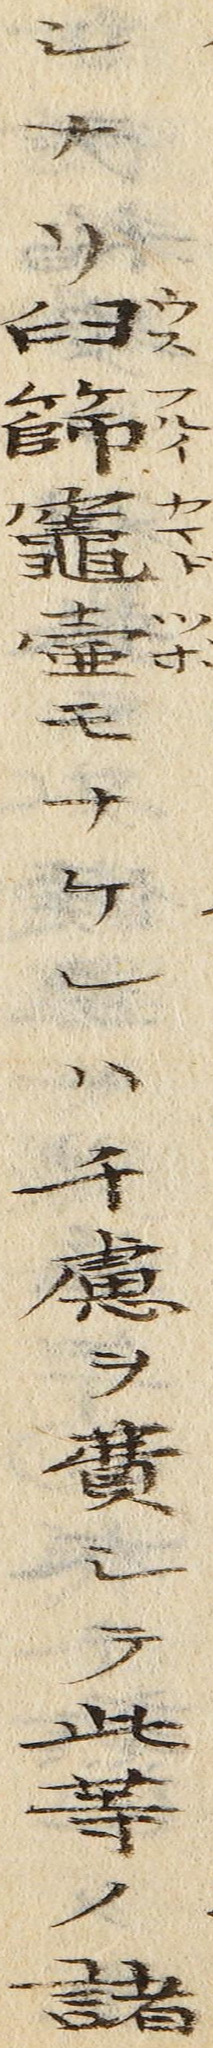シナリ臼篩竈壺モナケレハ千慮ヲ費シテ此等ノ諸
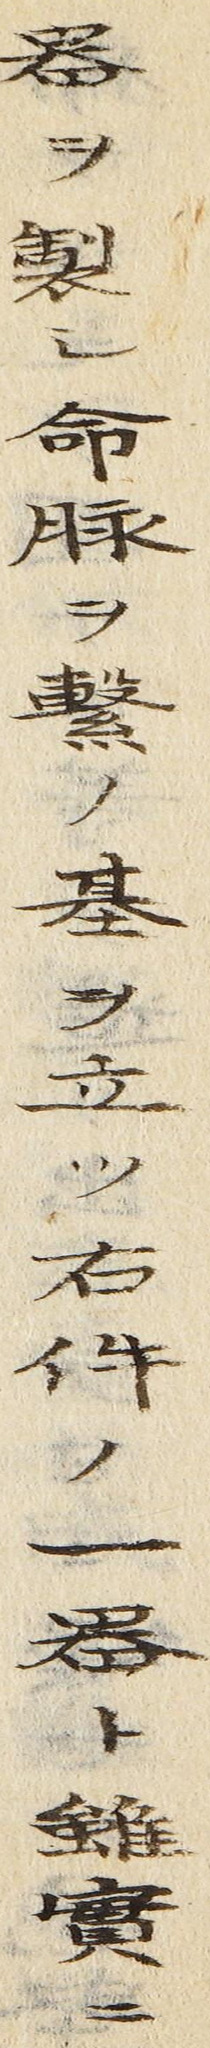器ヲ製シ命脈ヲ繋ノ基ヲ立ツ右件ノ一器ト雖実ニ
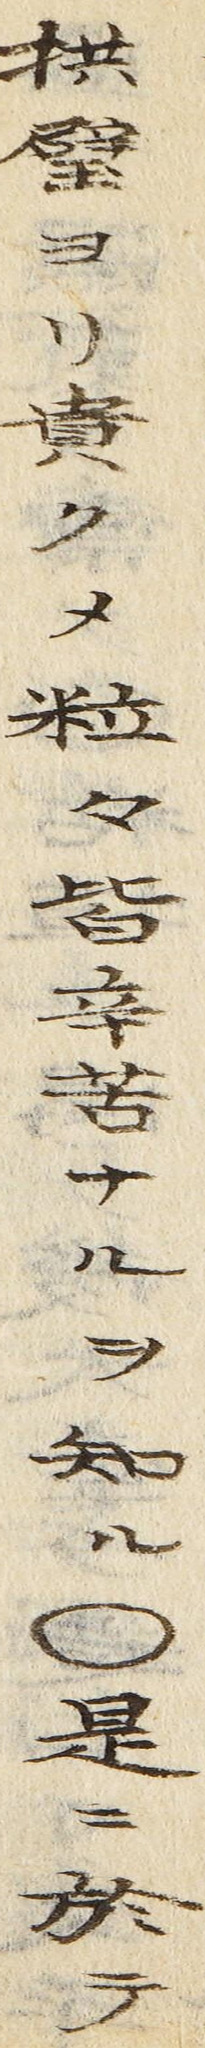拱璧ヨリ貴クシテ粒々皆辛苦ナルヲ知ル◯是ニ於テ
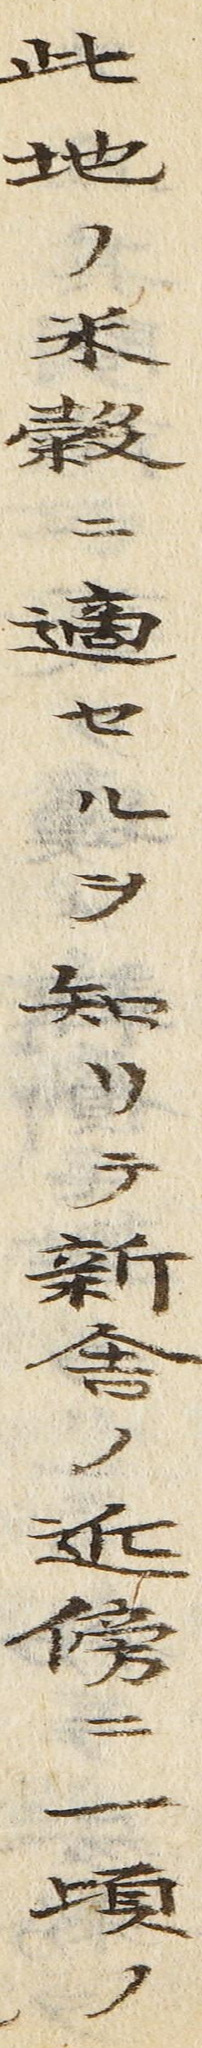此地ノ米穀ニ適セルヲ知リテ新舎ノ近傍ニ一頃ノ
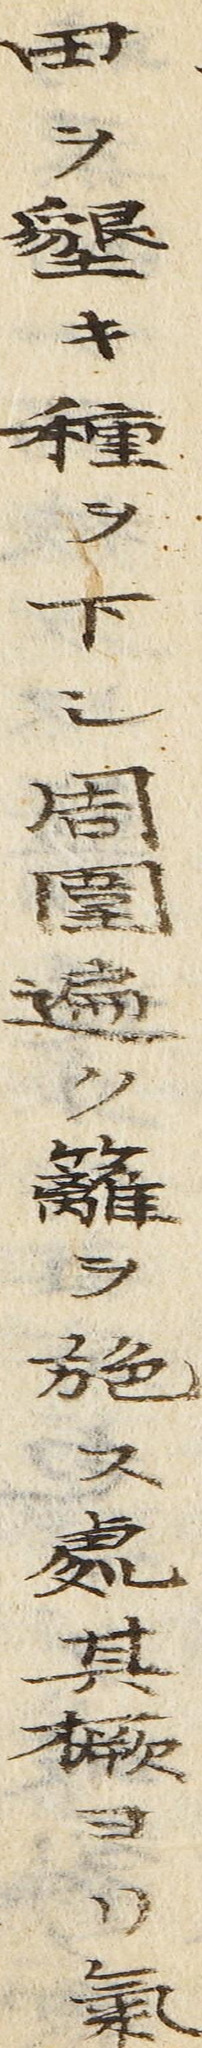田ヲ墾キ種ヲ下シ周囲遍ク籬ヲ施ス処其橛ヨリ気
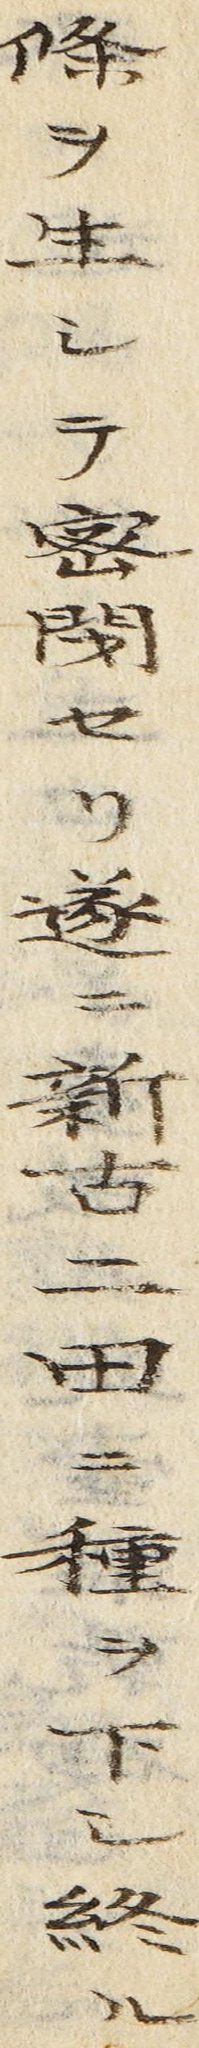條ヲ生シテ密閉セリ遂ニ新古二田ニ種ヲ下シ終ル
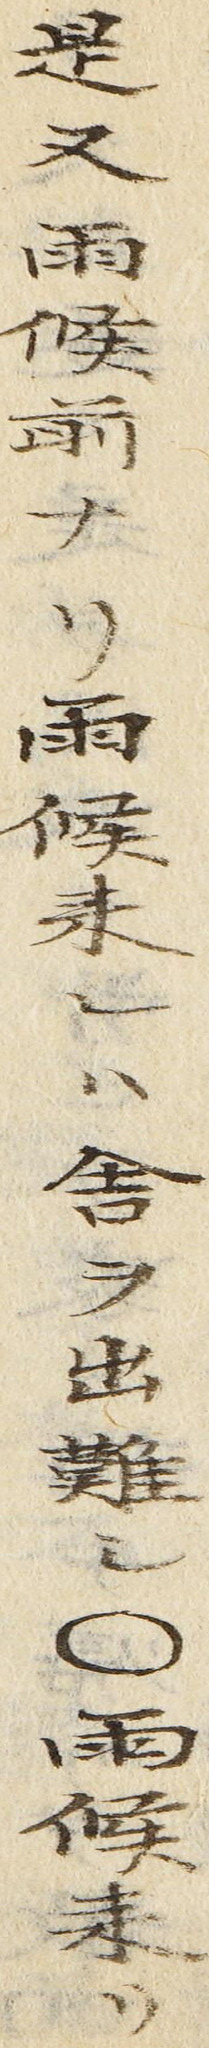是又雨候前ナリ雨候来レハ舎ヲ出難シ◯雨候来リ
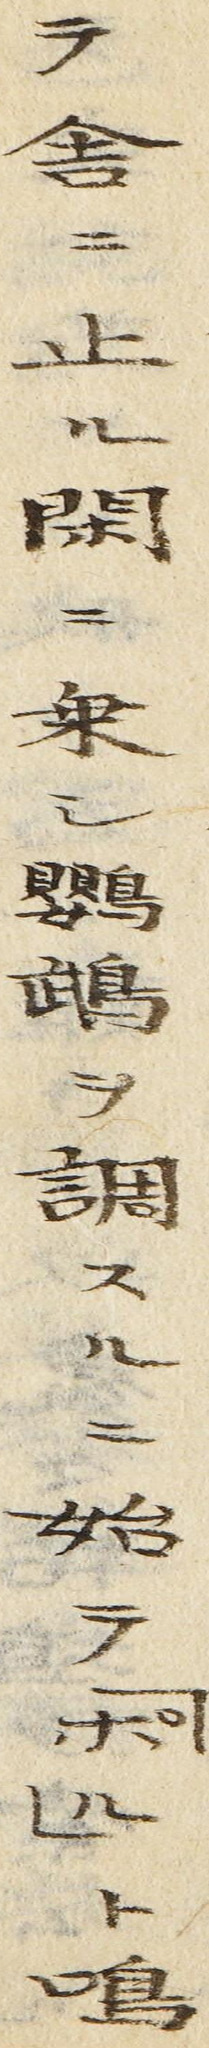テ舎ニ止ル閑ニ乗シ鸚鵡ヲ調スルニ始テ「ポル」ト鳴
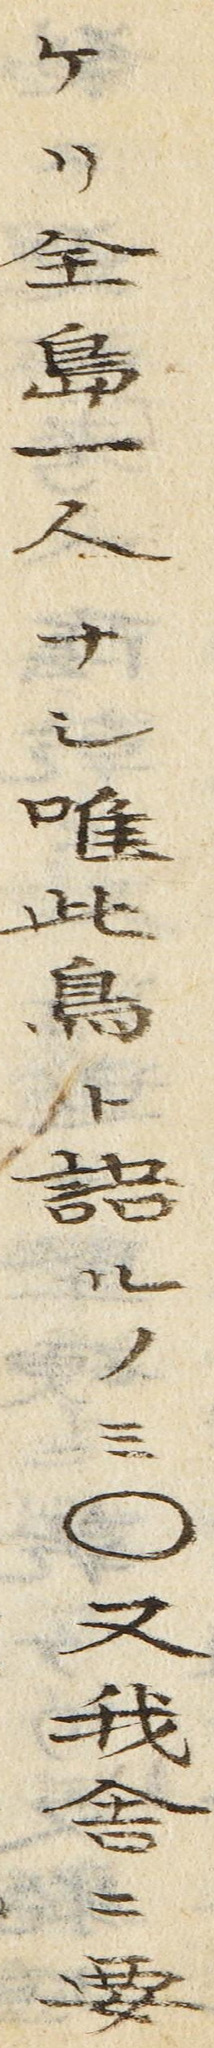ケリ全島一人ナシ唯此鳥ト語ルノミ◯又我舎ニ要
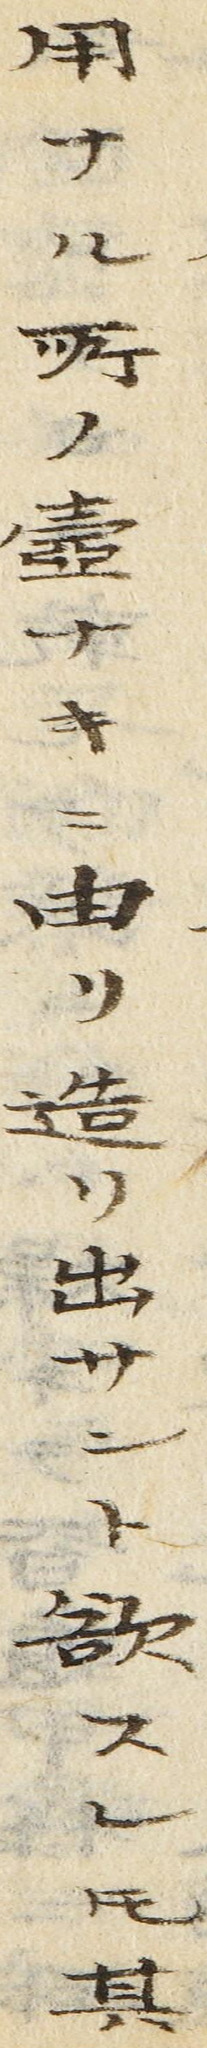用ナル所ノ壺ナキニ由リ造リ出サント欲スレトモ其
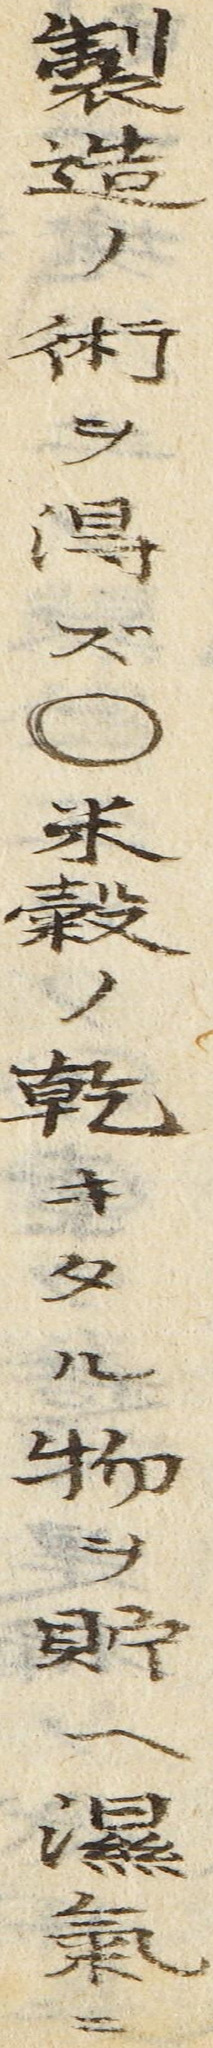製造ノ術ヲ得ズ◯米穀ノ乾キタタル物ヲ貯ヘ湿気ニ
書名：漂流紀事
